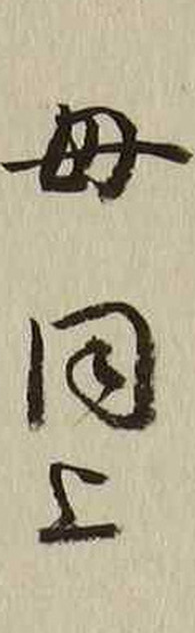母同上
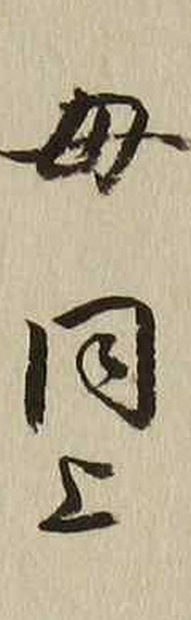母同上
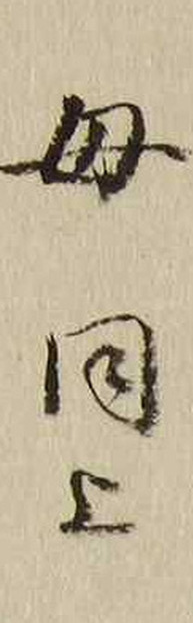母同上

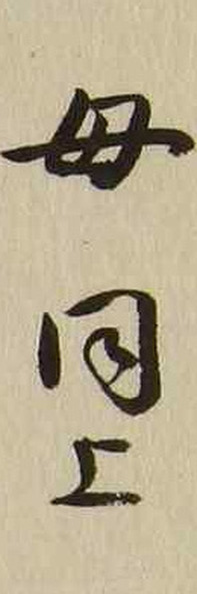母同上
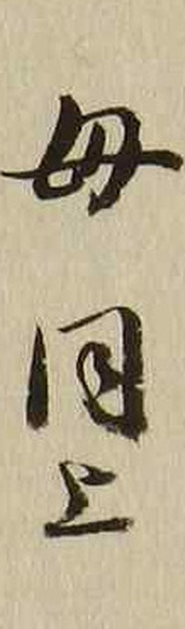母同上
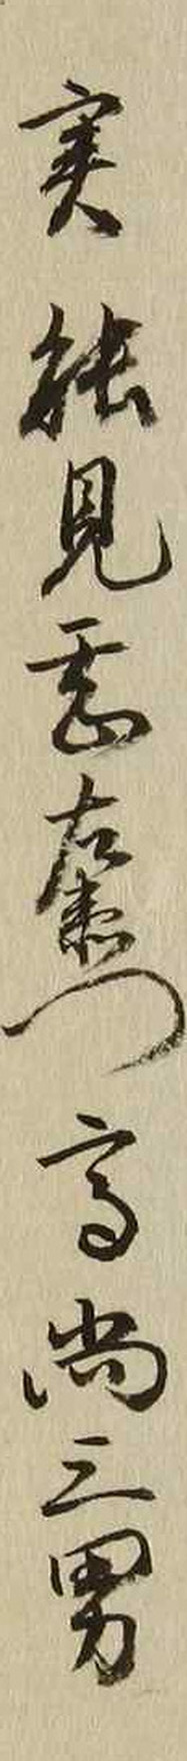実能見甚左衛門高尚三男
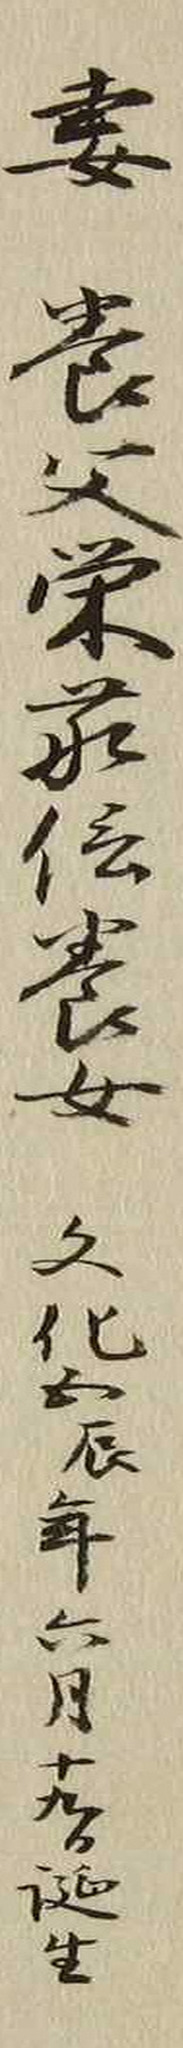妻養父栄敬信養女文化五辰六月十九日誕生
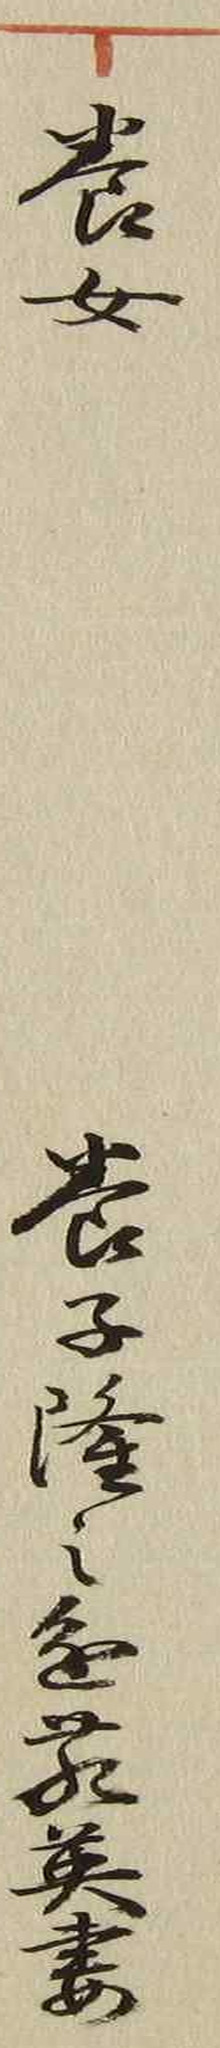養女養子隆之進敬英妻
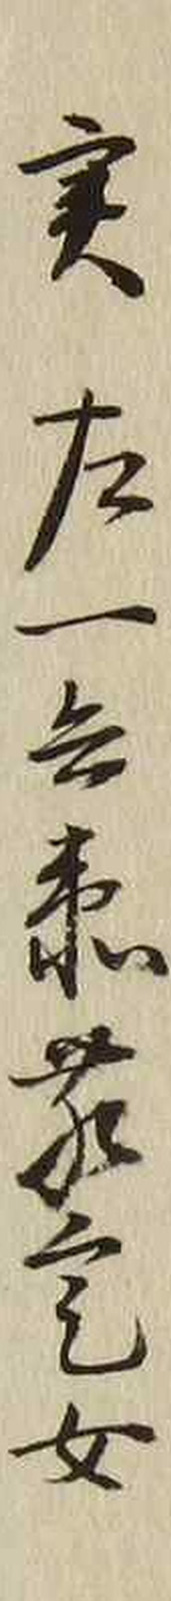実左一兵衛敬定女
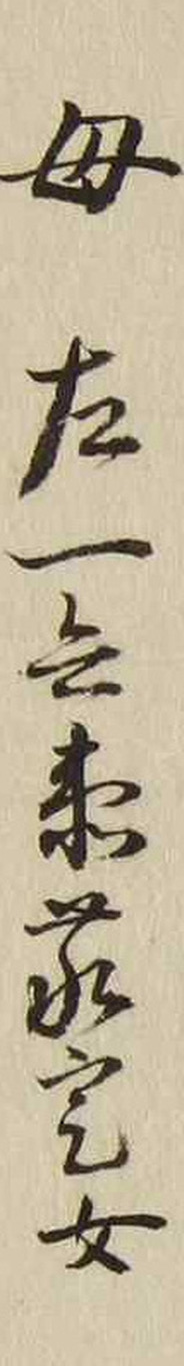母左一兵衛敬定女

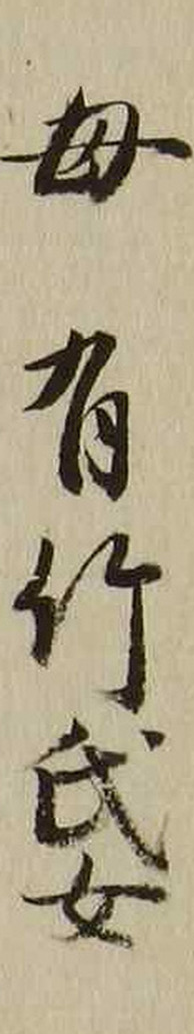母有竹氏女
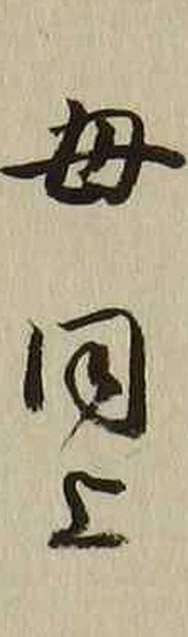母同上
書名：諸士系譜　巻之61　と之部4
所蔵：会津若松市立会津図書館
